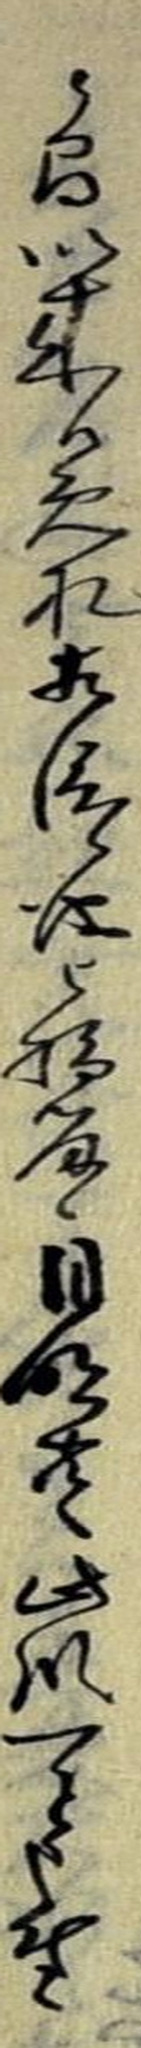候間以来ハ免札相渡候儀被指留候目明共へ此段可被申付候
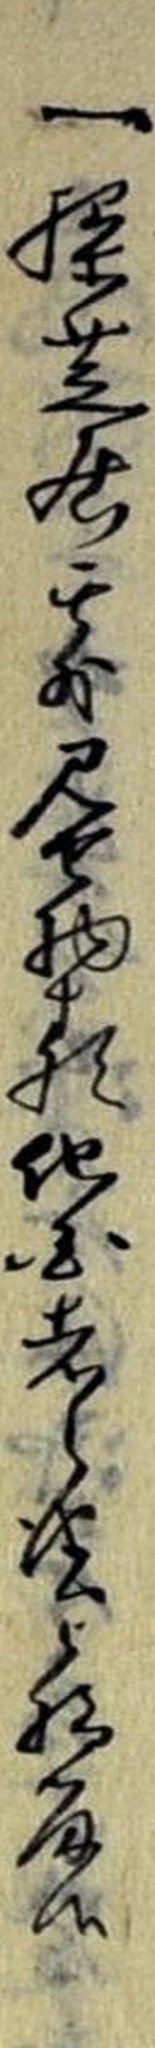一操芝居其外見セ物類他国者之儀ハ被指留候
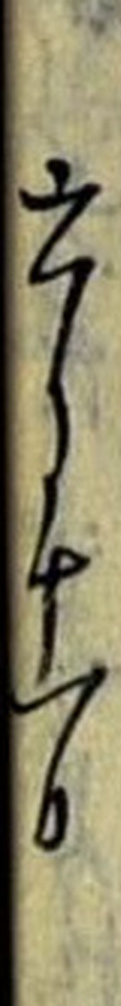六月十一日
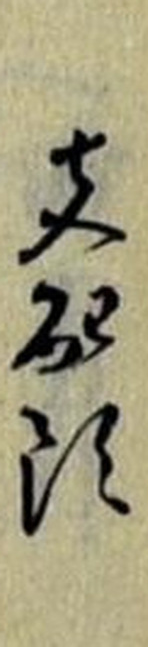支配頭
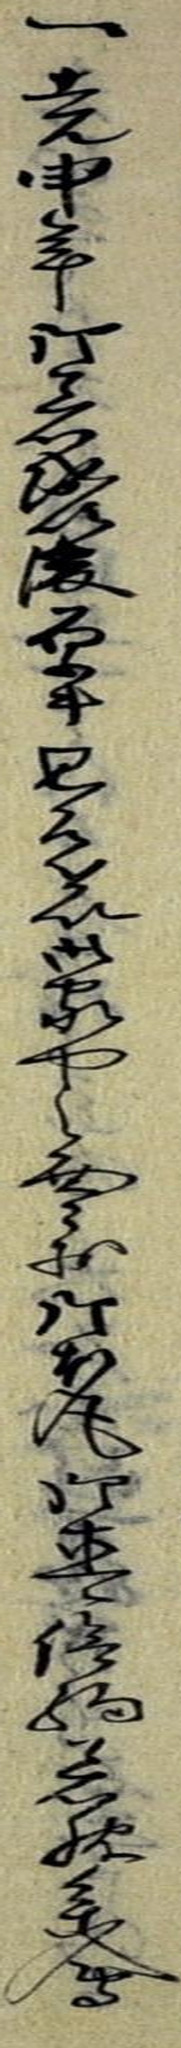一去ル申年御着城以後厚キ思召を以御家中之面々於御本丸御直ニ倹約着服参会
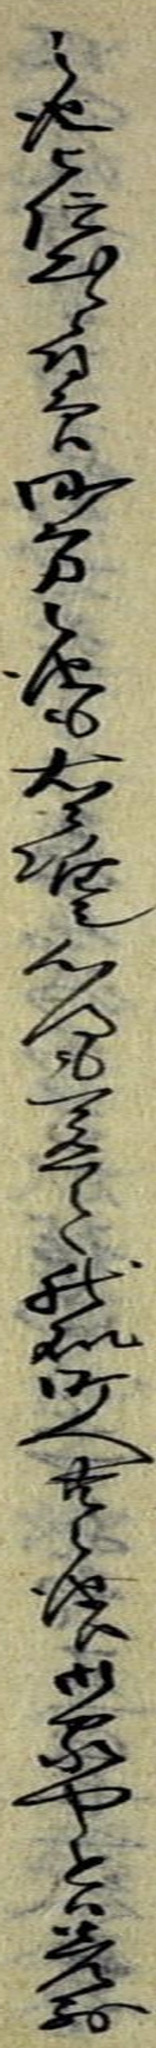之儀被仰出候ニ付而ハ町方之儀も右ニ准シ心得も可有之候然処町人共之儀ハ御家中とハ差別
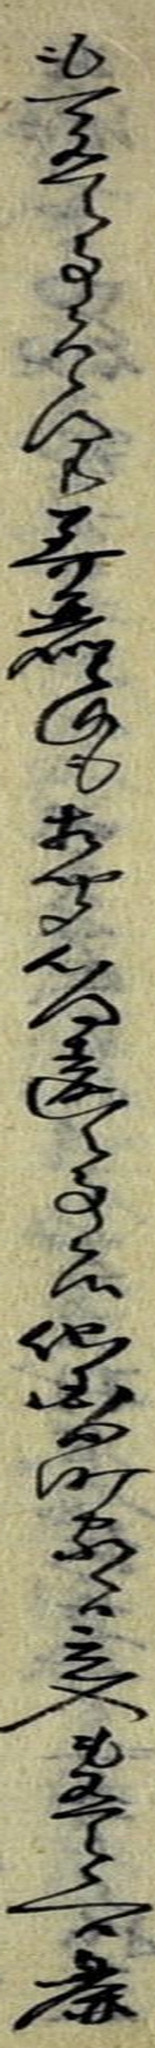も可有之事ニハ候得共華麗之趣も相聞心得違之事ニ候他国ゟ町家ヘハ立入も有之候ヘハ麁
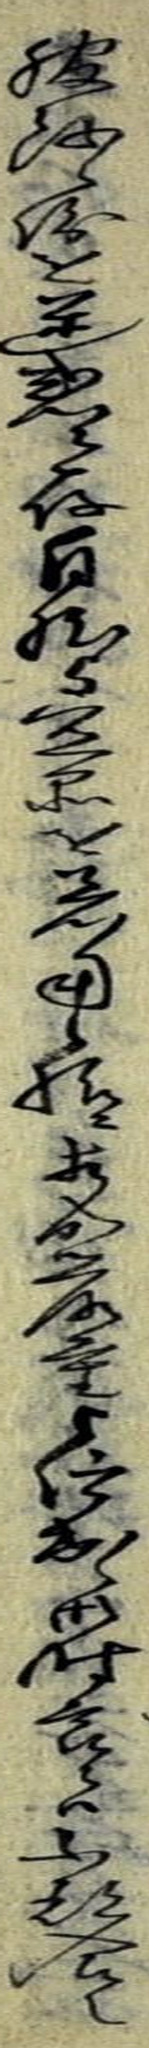服致候儀を迷惑ニ存自然与宜品を着用候様ニ相成厳重被仰出候御時節ニハ不都合之
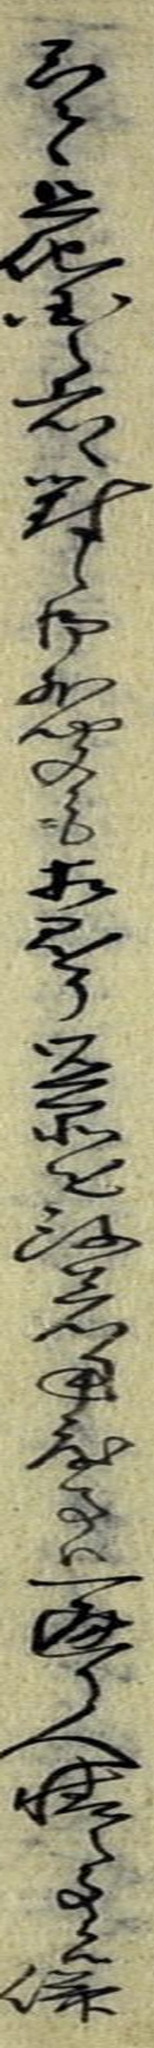至ニ候且他国之者へ対し御外聞ニも相懸り宜品を致着用度事ハ一通り人情之事ニ候併
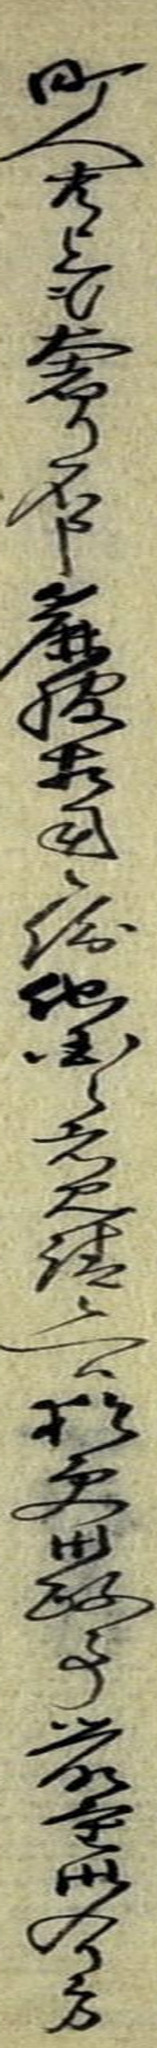町人共迄も奢り不申麁服相用候儀他国之者見請候ヘハ猶更御政事厳重御〆り方
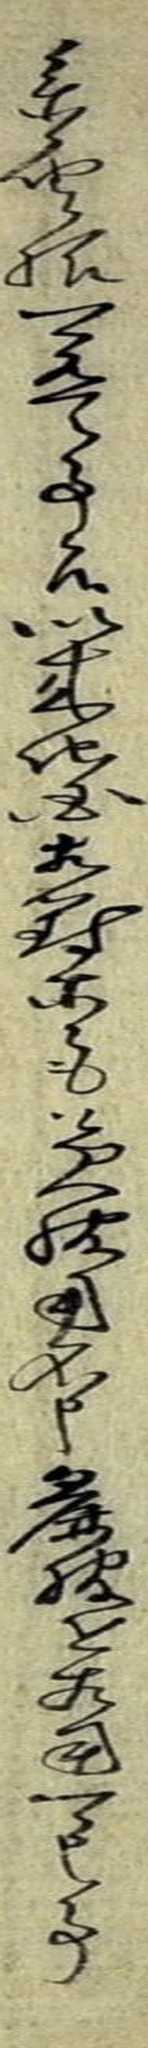参届候様可有之事ニ候以来他国相対等ニも美服用不申麁服を相用可申候事
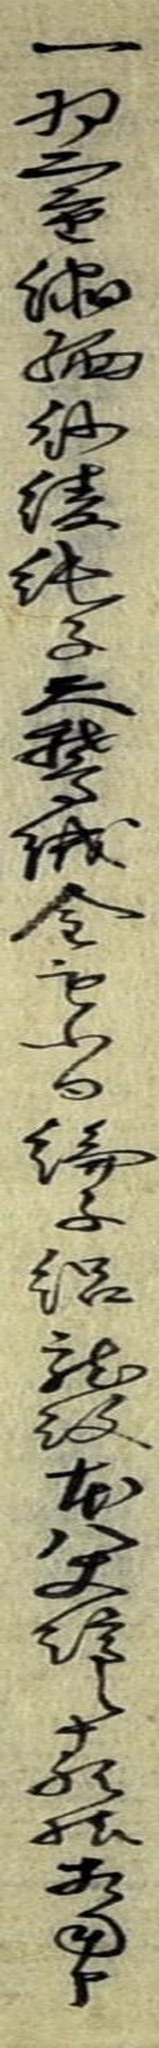一羽二重縮緬紗綾純子天鵞絨勤もふる綸子絽龍紋本八丈縞之類様相用申
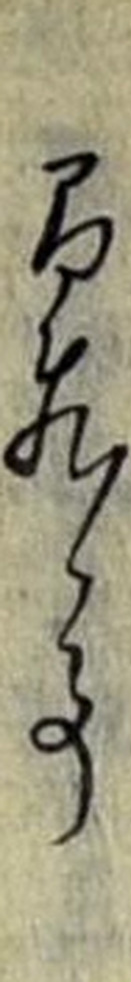間敷候事
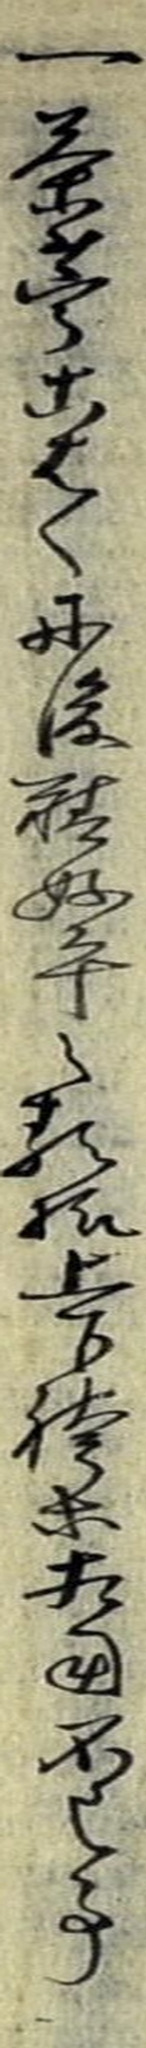一茶苧こはく丹後精好平之類様上下袴等相用不申候事
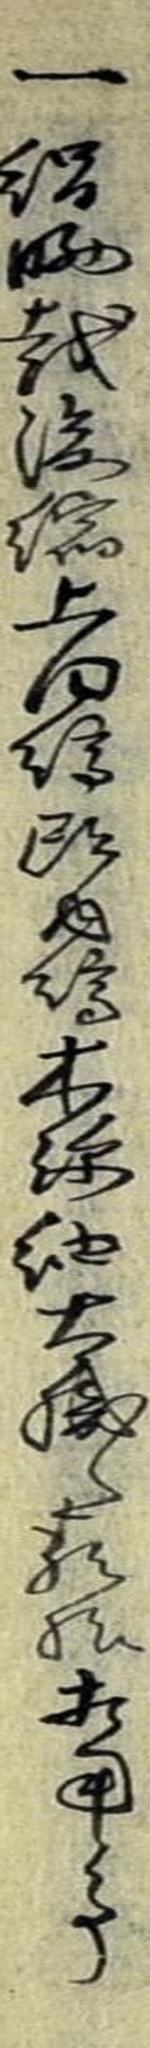一絹晒越後縮上田縞郡内縞木綿紬太織之類様相用候事
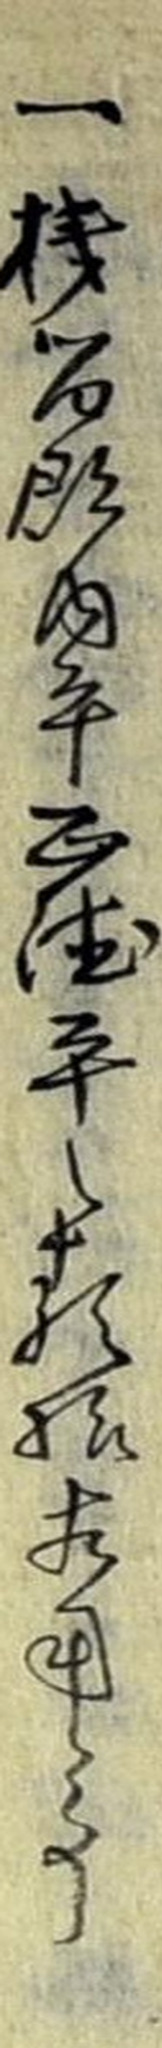一桟留郡内平正徳平之類様相用候事
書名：命令之部 三
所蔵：福井県文書館 Fukui Prefectural Archives
